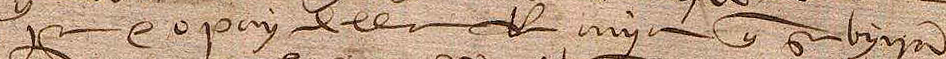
tsa e o pay della Re auja q̄ se vyerā
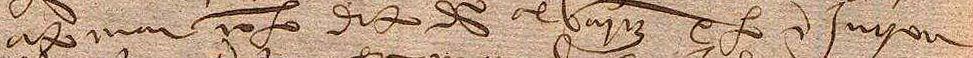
a tomar c̄o ho dito djo alvarez e ho ēJurjou
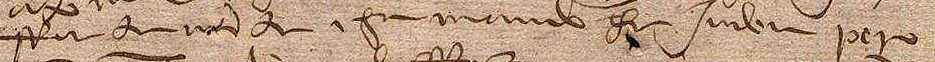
ffortemēte chamando lhe Judeu pero
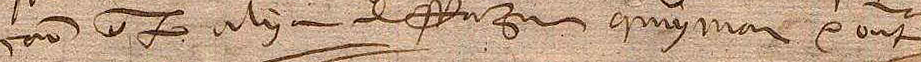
cão q̄ ho avya de ffazer queymar e outras
